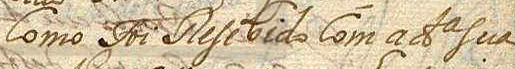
Como Foi Resebido Com a d̄a sua
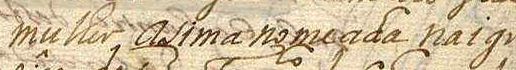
mulher asima nomeada na igr
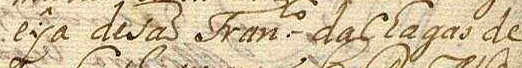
eya de saõ Fran.co da Chagas de
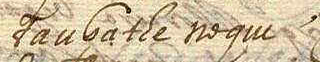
taubathe no que
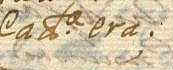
e a d̄.a era.
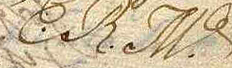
E. R. M.ce
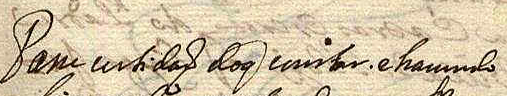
Passe certidaõ do q̄ constar. e hauendo
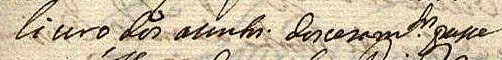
liuro dos acentos. dos cazam.tos passe
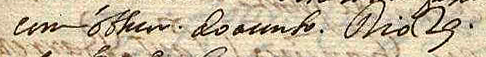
com o theor. do acento. Rio 29.
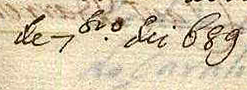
de 7.bro de i689
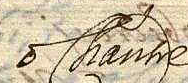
o Chantre
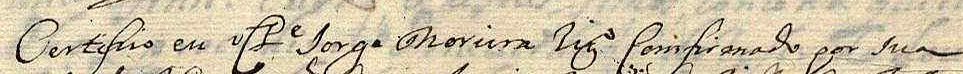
Certifico eu o Pe Iorge Moreira Vigo Comfirmado por sua
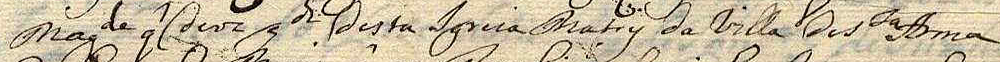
Magde q̄ deoz gde desta Igreia Matris da Villa de sta Anna
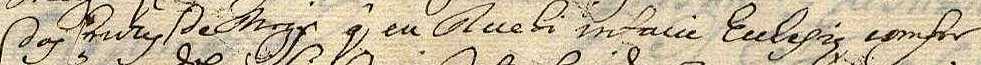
das Cruzes de Mogy q̄ eu Recebi in facie Ecclesiæ comfor
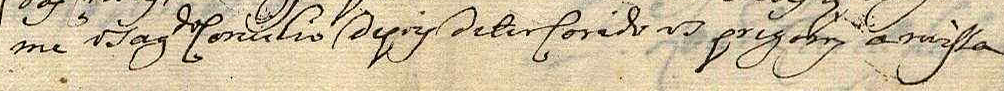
me o sagdo Concilio depois de ter Corido os pregadores a missa
